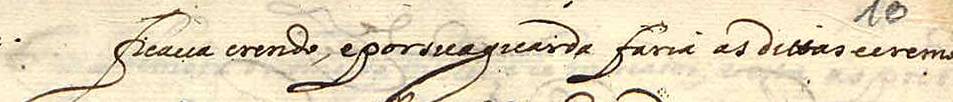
ficaua crendo, e por sua guarda as dittas ceremo
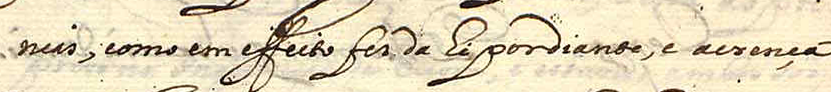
nias, como em effeito fes dahi por diante, e a crença
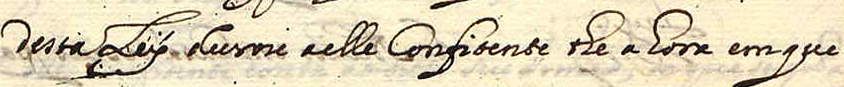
desta Ley durou a elle Confitente the a hora em que
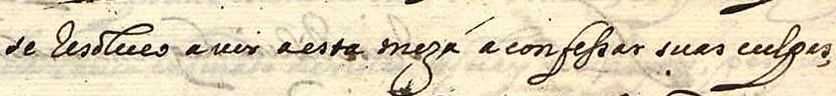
se Resolueo a uir a esta meza a confessar suas culpas,
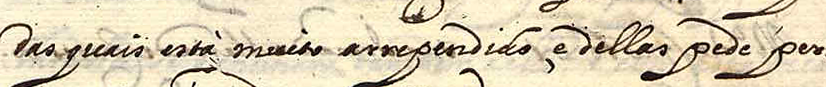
das quais està muito arrependido, e dellas pede per
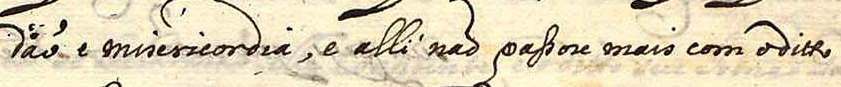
daõ e misericordia, e alli naõ passou mais com o ditto
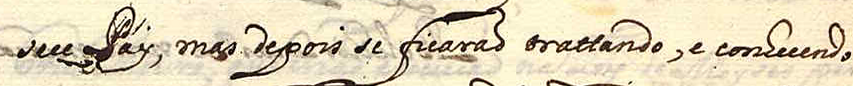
seu Pay, mas depois se ficaraõ trattando, e conhecendo
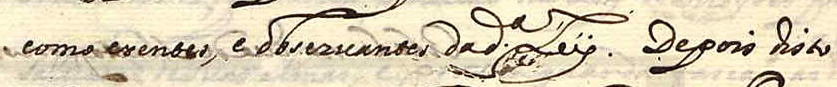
como crentes, e obseruantes da d.a Ley. Depois disto
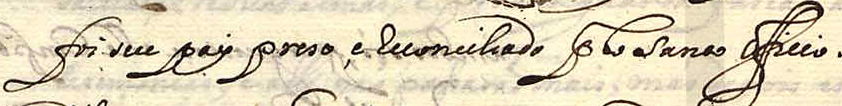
foi seu pay preso, e Reconciliado p̄lo santo officio.
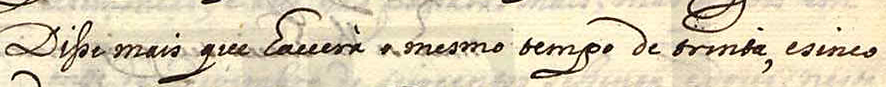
Disse mais que hauerà o mesmo tempo de trinta, e sinco
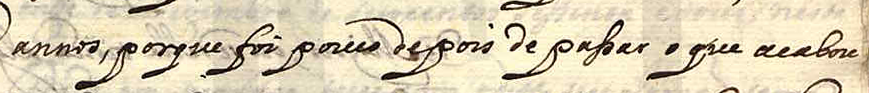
annos, porque foi pouco depois de passar o que acabou
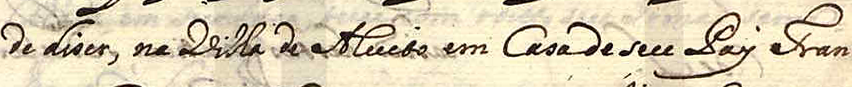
de diser, na Villa de Aluito em Casa de seu Pay Fran
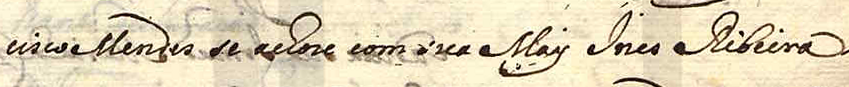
cisco Mendes se achou com sua May Ines Ribeira
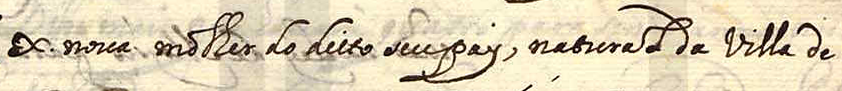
x. noua molher do ditto seu pay, natural da Villa de
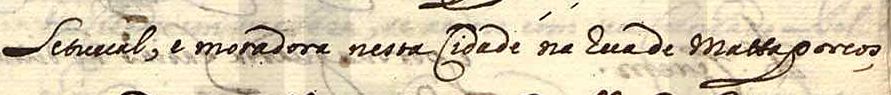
Setuual, e moradora nesta Cidade na Rua de matta porcos,
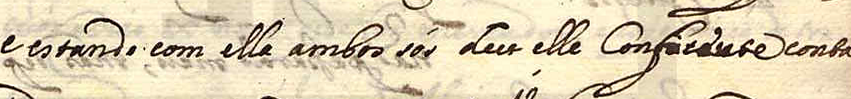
e estando com ella ambos sós deu elle Confitente conta
